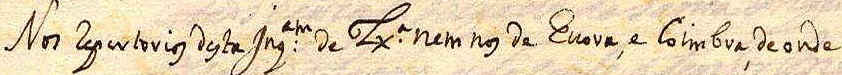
Nos Repertorios desta Jnqam: de Lx.a nem nos de Euora, e Coimbra, de onde
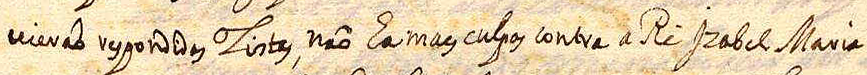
uieraõ respondidas Listas, naõ ha maes culpas contra a Ré Jzabel Maria
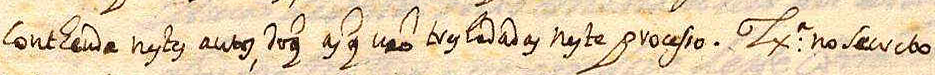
Contheuda nestes autos, do q̄ as q̄ uaõ tresladadas neste processo. Lx:a no Secreto
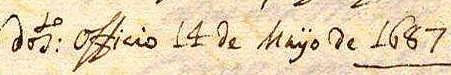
do s.to officio 14 de Mayo de 1687:
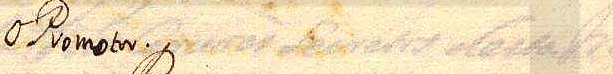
O Promotor.
